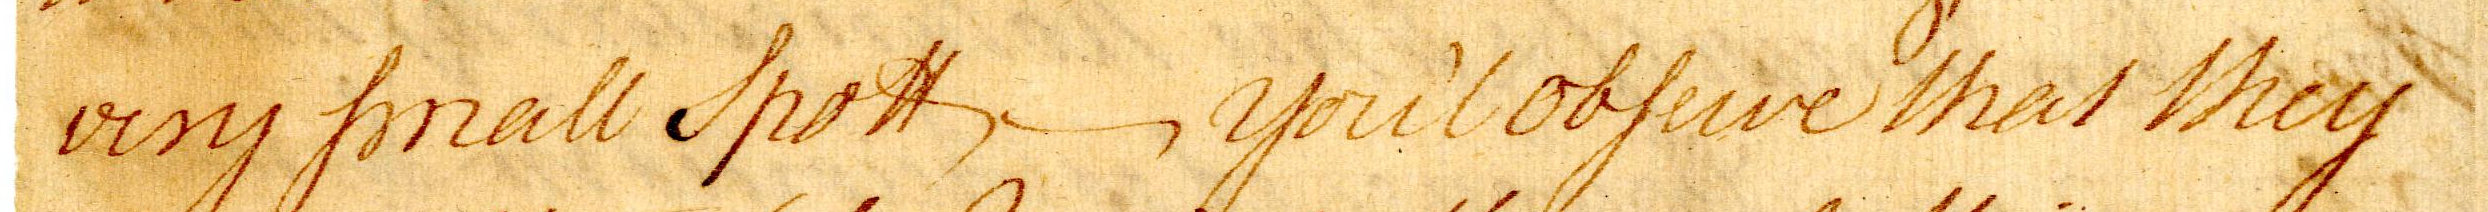very small spott- You'l observe that they
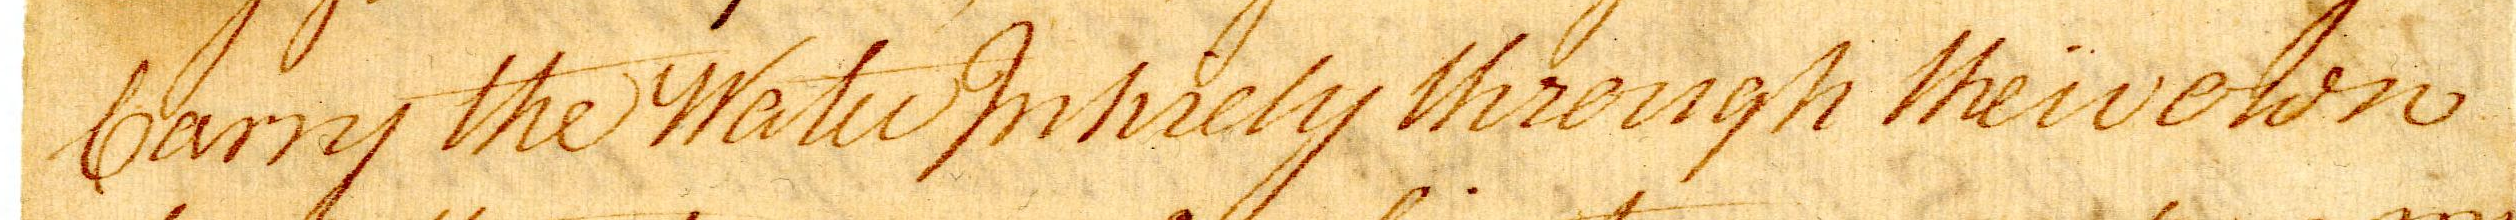Carry the Water Intirely through their own
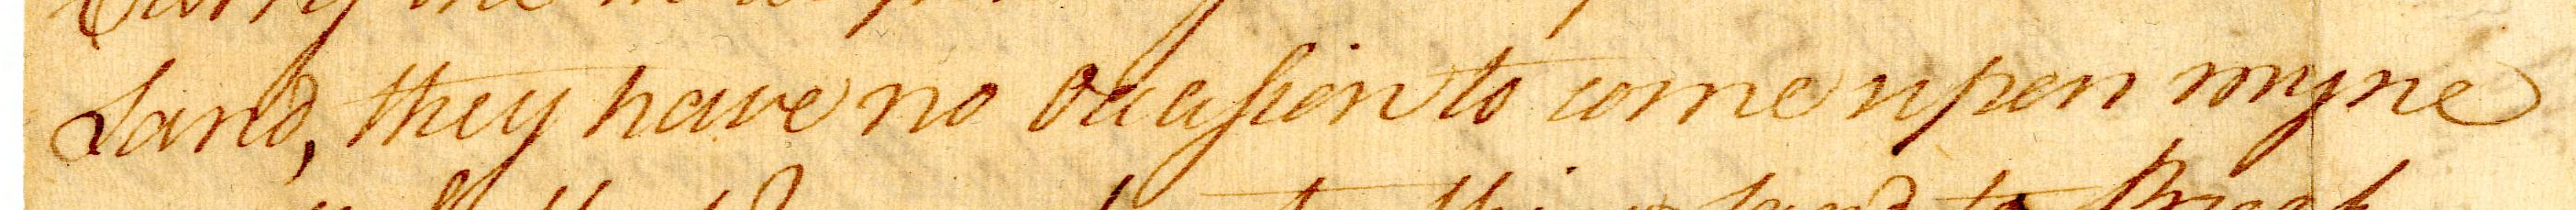Sand, they have no occasion to come upon myne
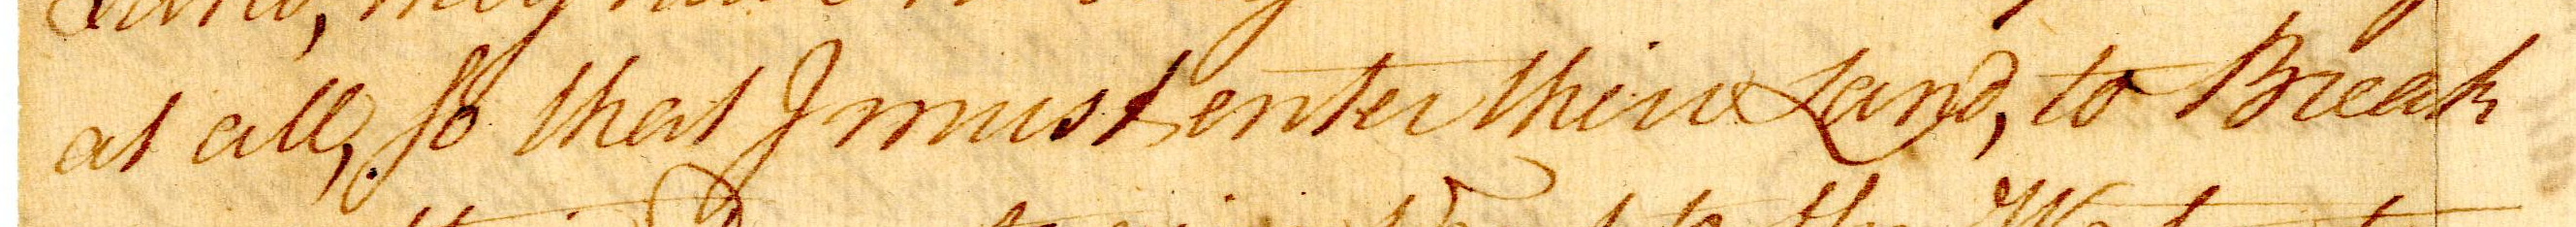at all, so that I must enter their Land, to Break
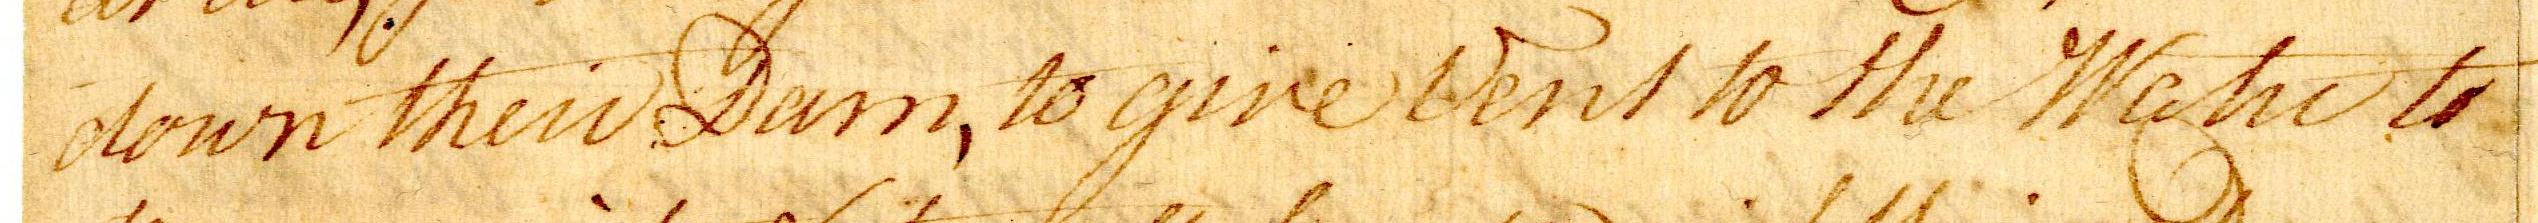down their Dam, to give Vent to the Wake to
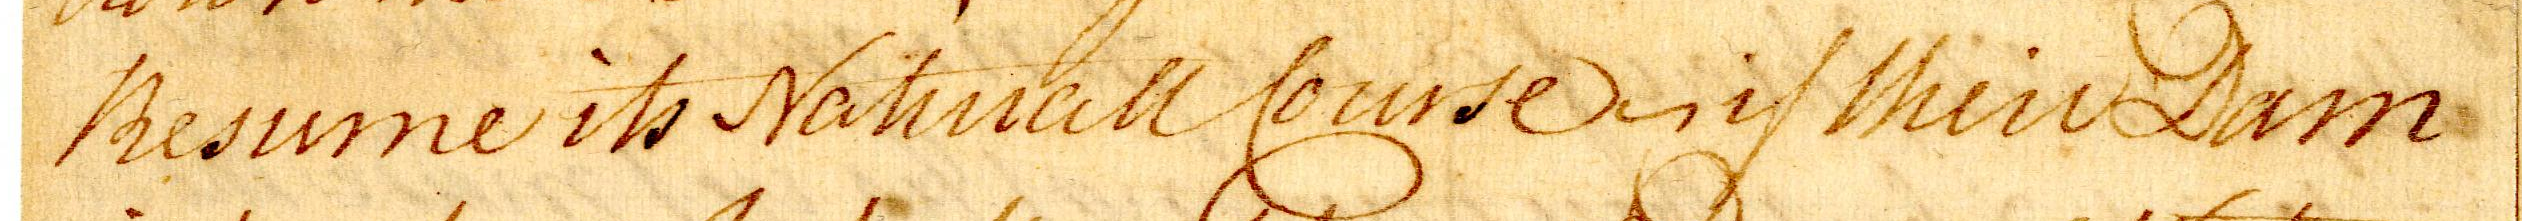Resume its Naturall Course- if their Dam
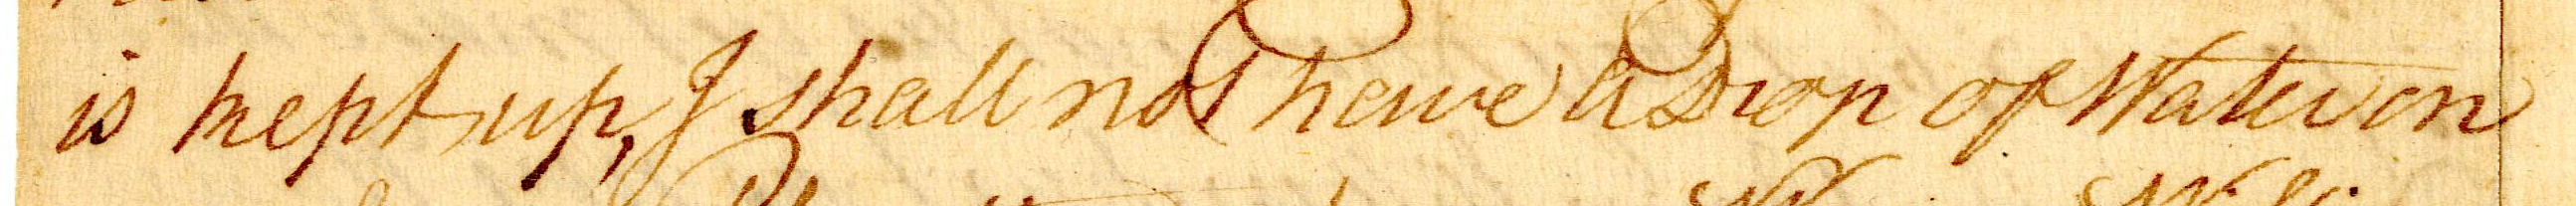is kept up, I shall not have A Drop of Water on
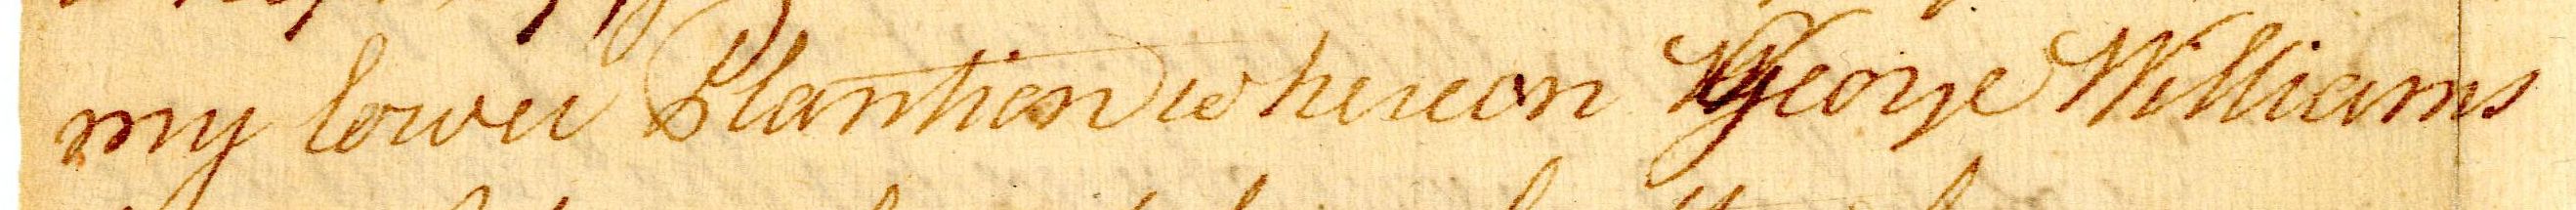my lower Plantation whereon George Williams
